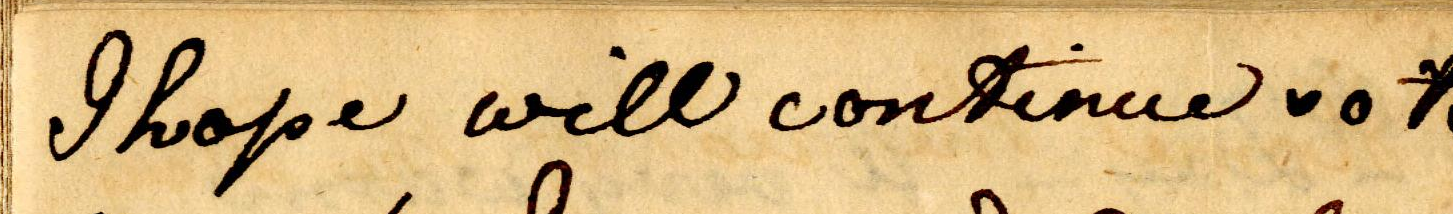I hope will continue so
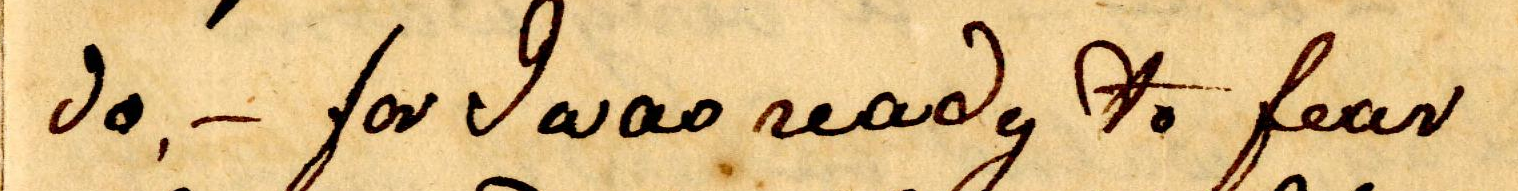do,- for I was ready to fear
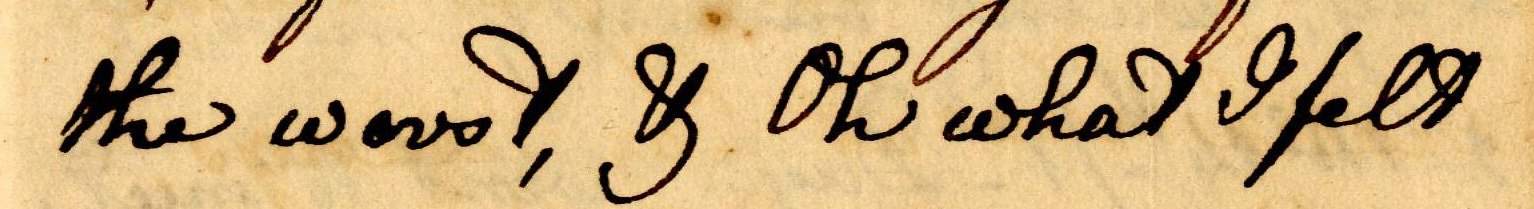the worst, & Oh what I felt
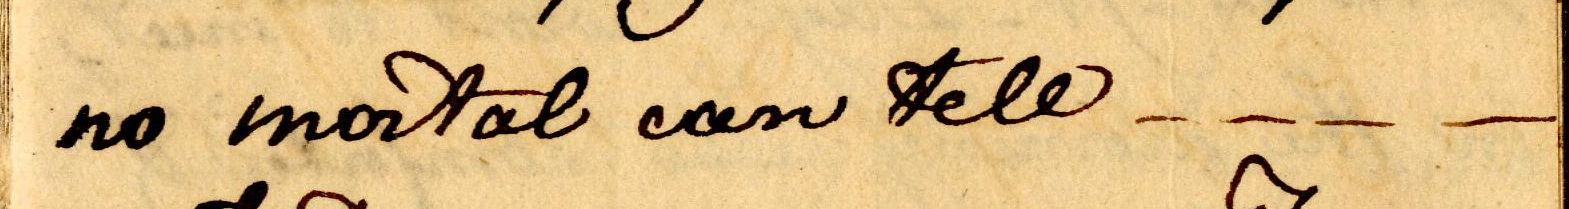no mortal can tell -
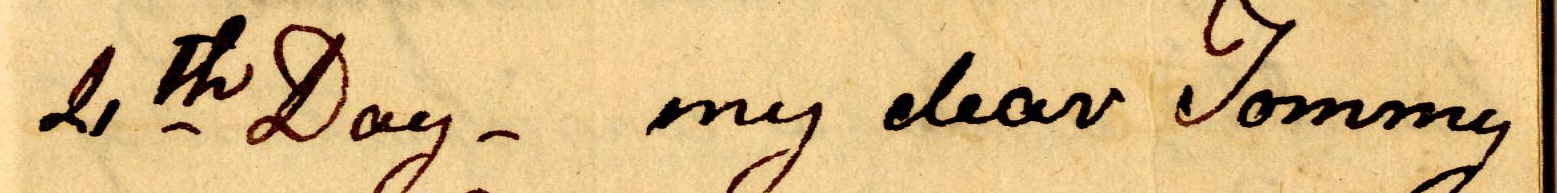4^th Day- my dear Tommy
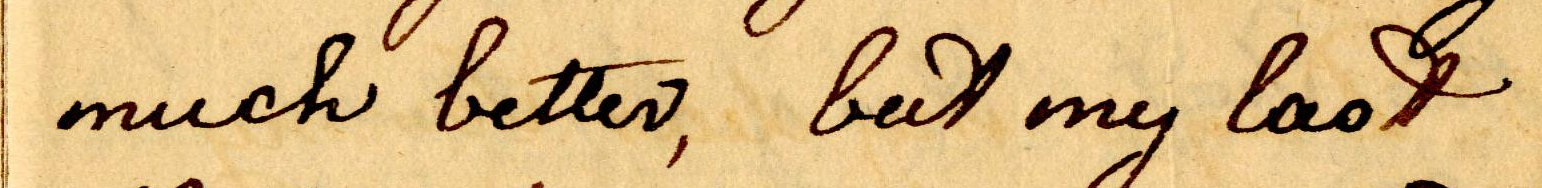much better, but my last
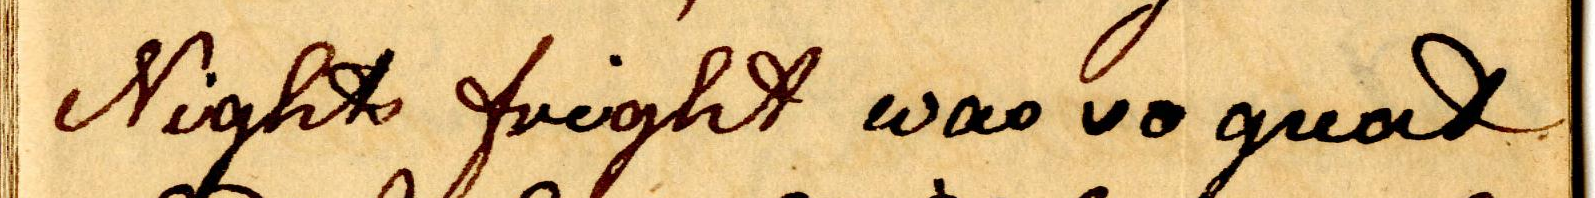Nights fright was so great
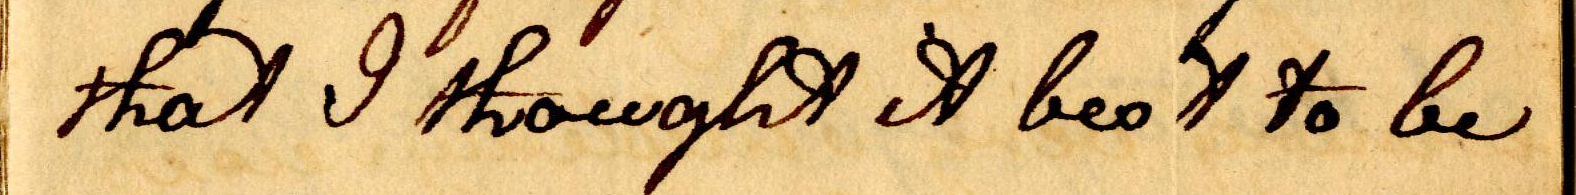that I thought it best to be
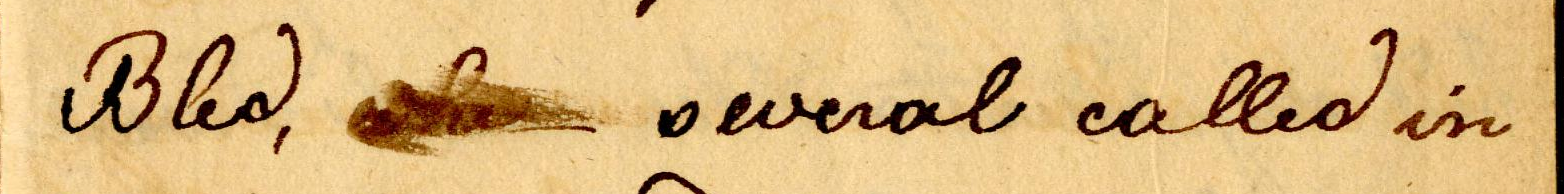Bled, [___] several called in
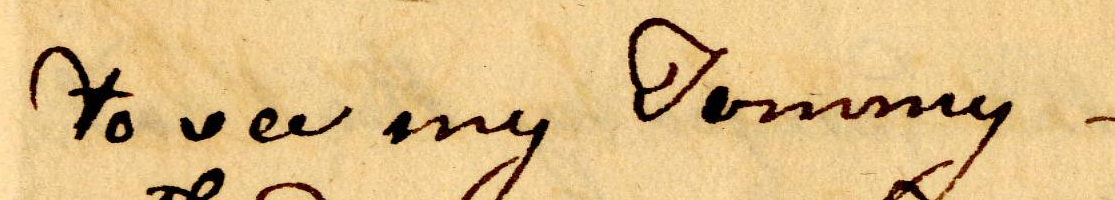to see my Tommy-
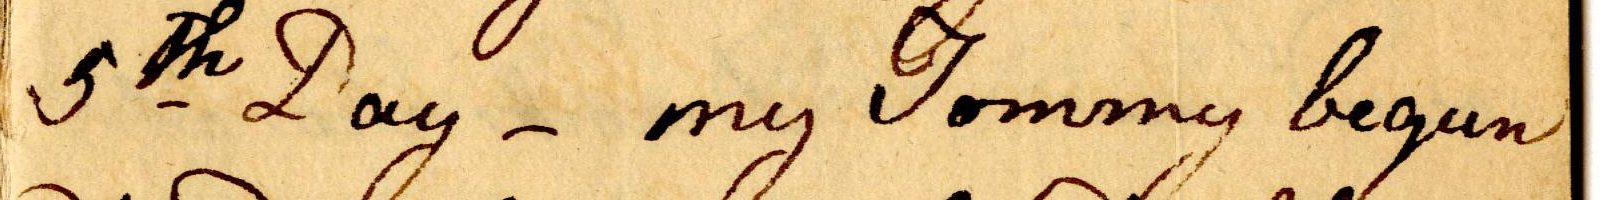5^th Day- my Tommy begun
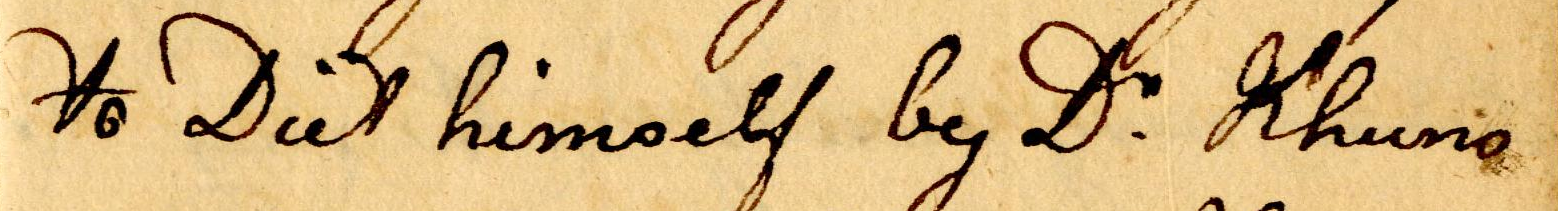to Diet himself by D^r. Khuns
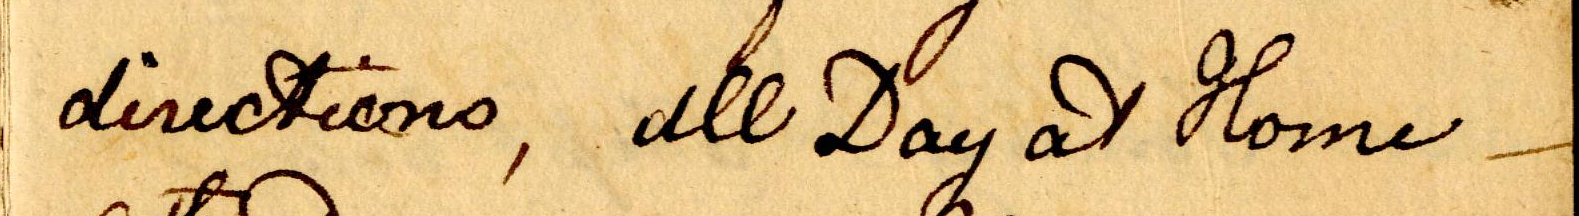directions, all day at Home
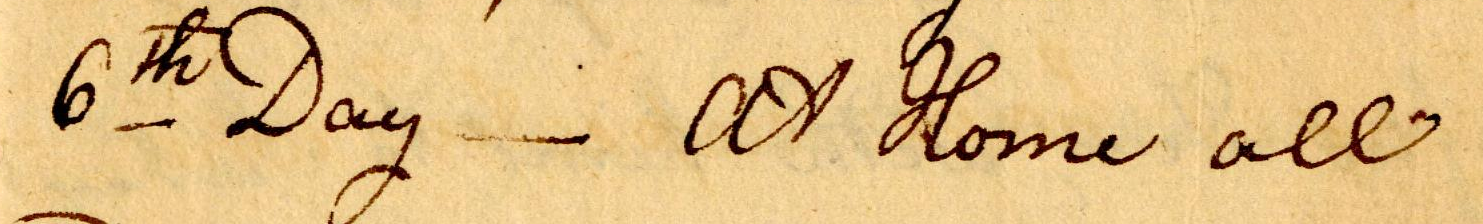6^th Day- At Home all
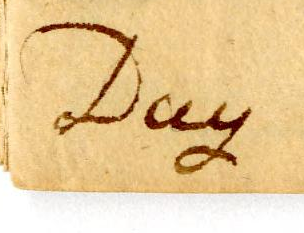Day
